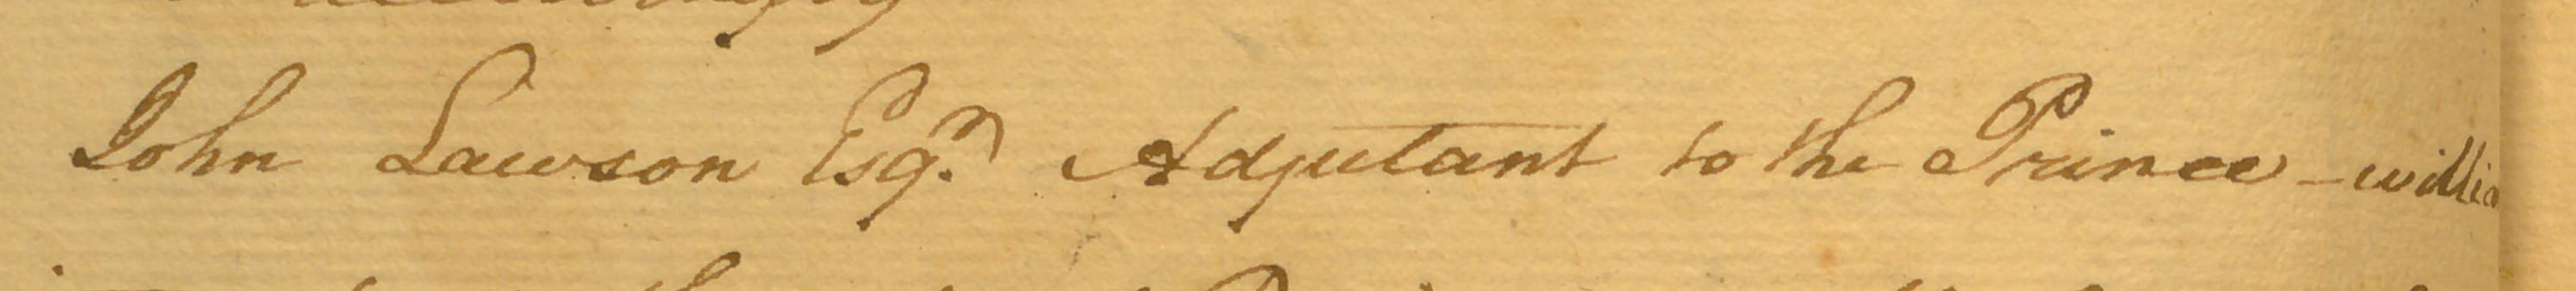John Lawson Esq^r. Adjutant to the Prince-william
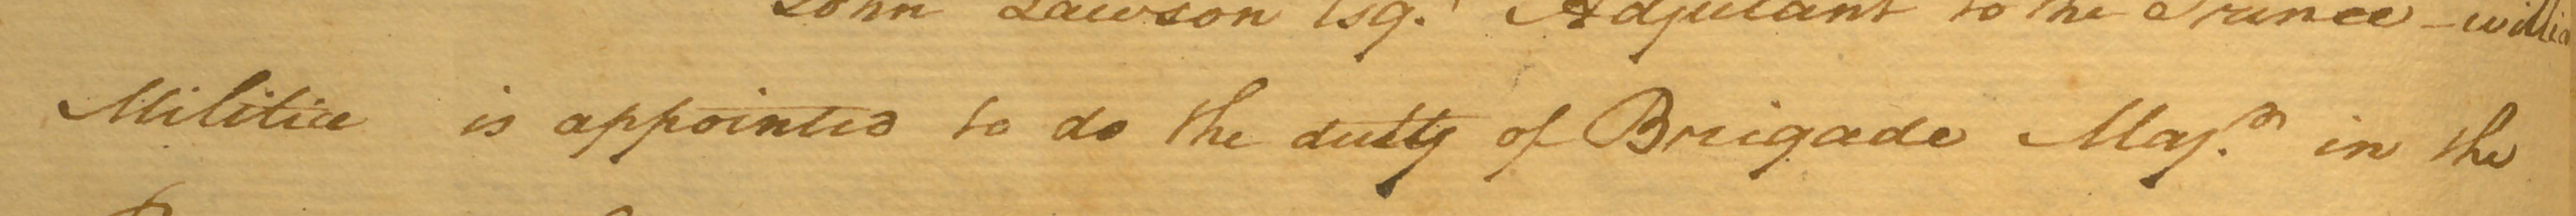Militia is appointed to do the duty of Brigade Maj^r. in the
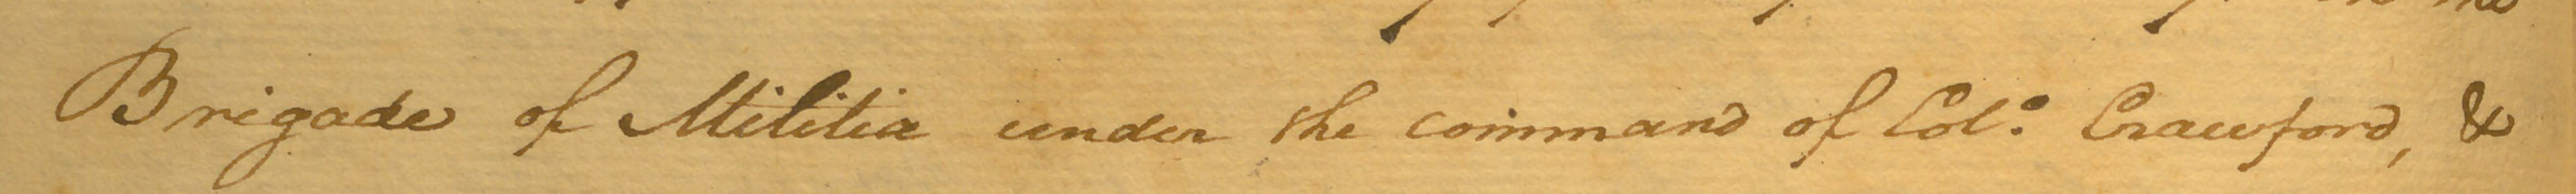Brigade of Militia under the command of Col^o. Crawford, &
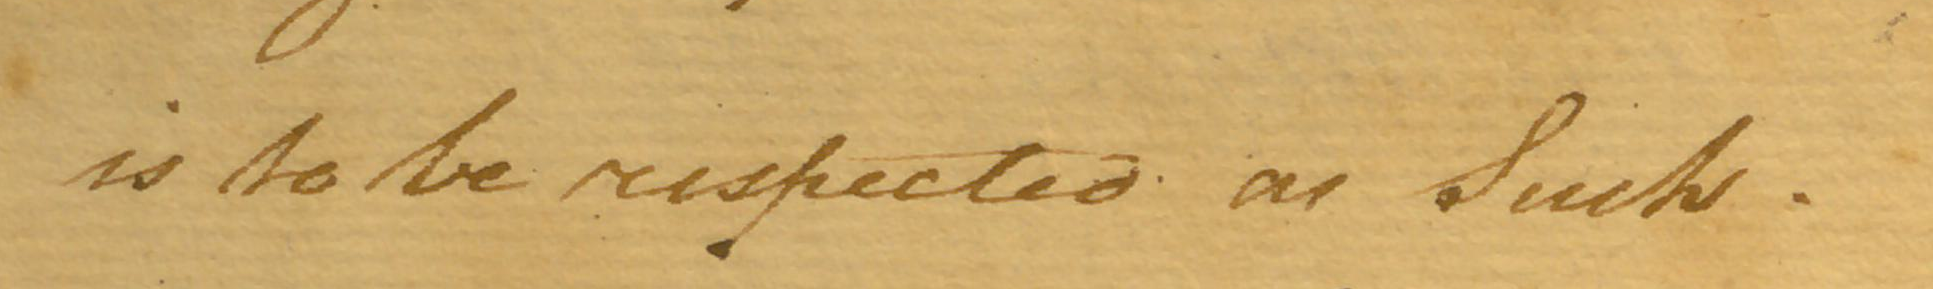is to be respected as Such.
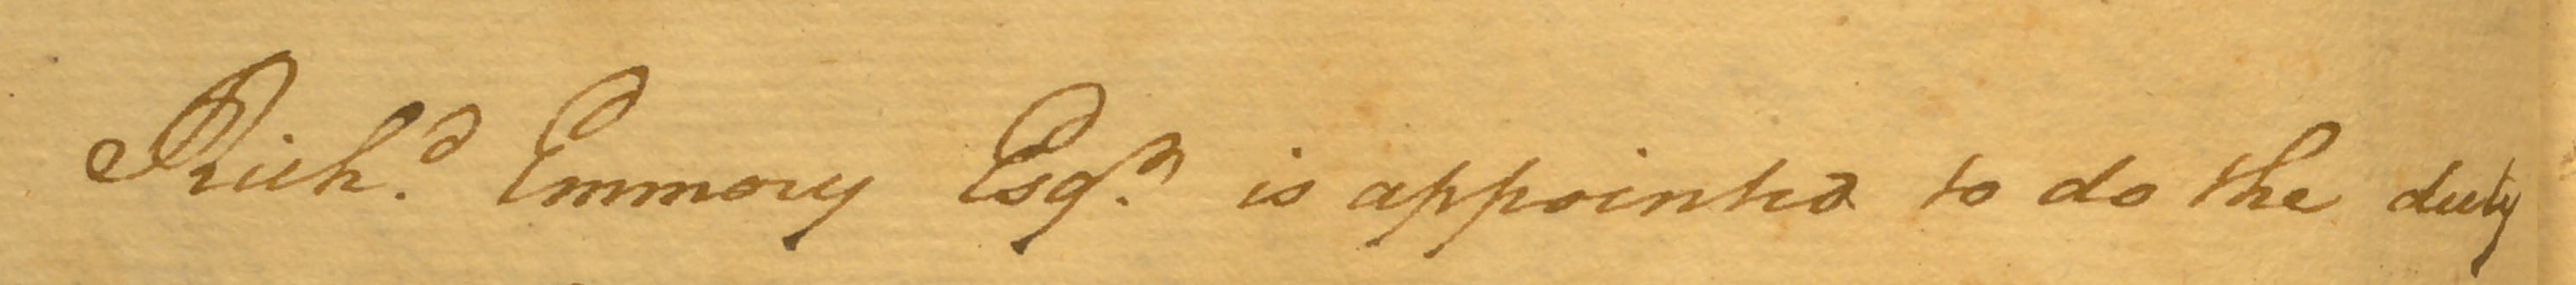Rich^d. Emmory Esq^r. is appointed to do the the duty
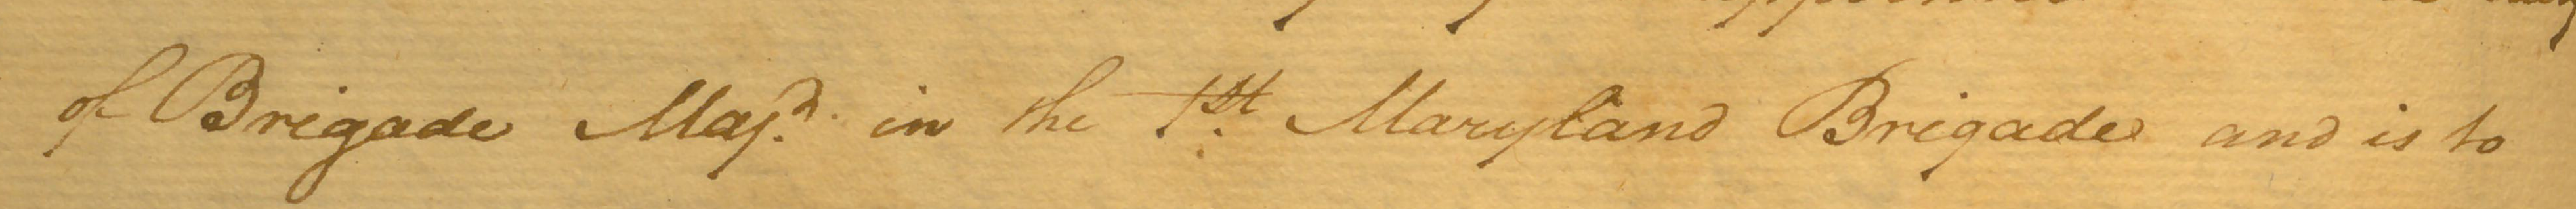of Brigade Maj^r. in the 1^st. Maryland Brigade and is to
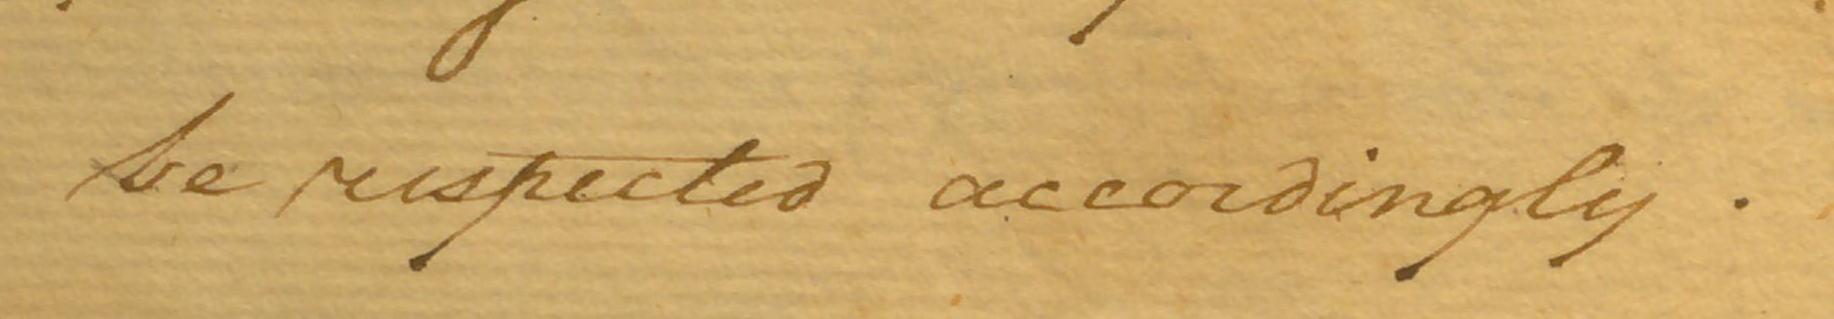be respected accordingly.
